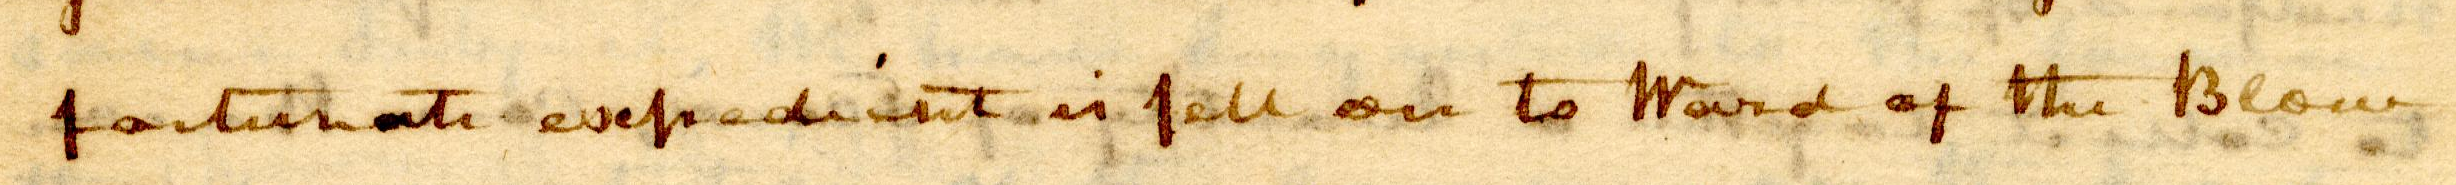fortunate expedient is fell on to Ward of the Blow
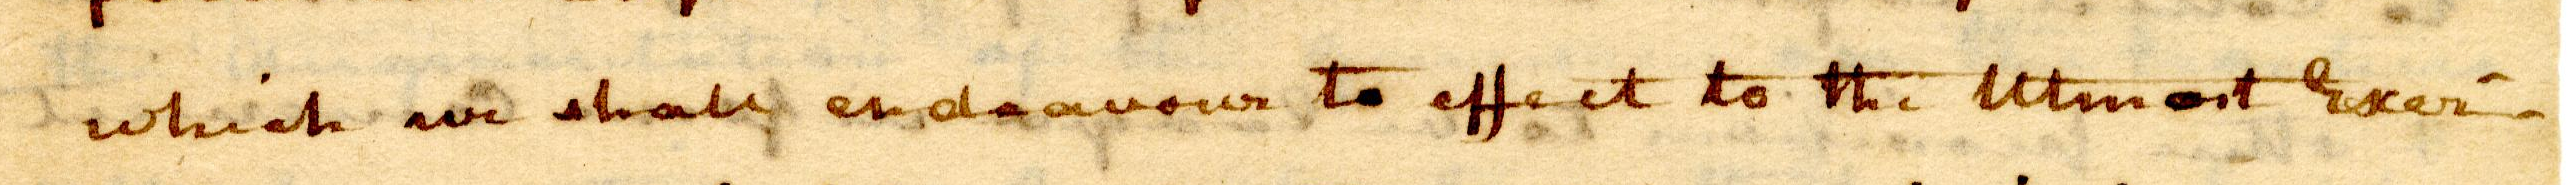which we shall endeavour to effect to the Utmost Exer-
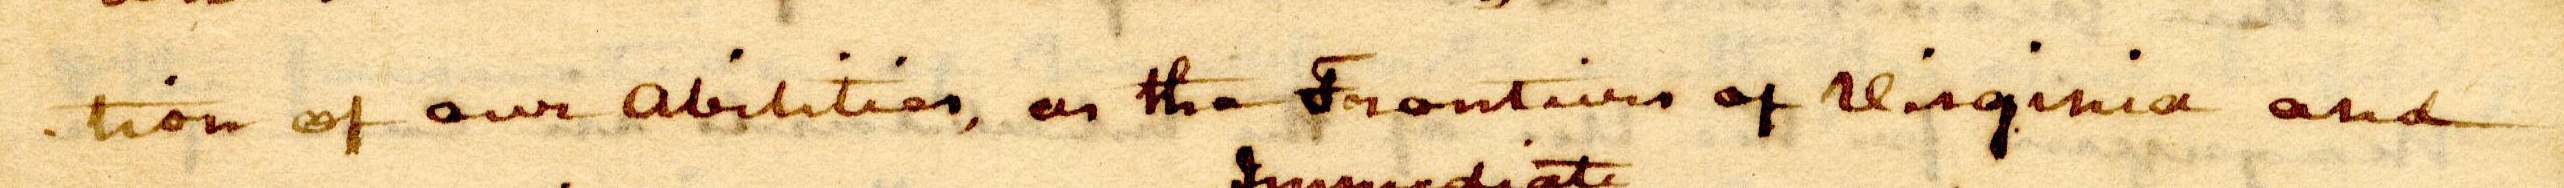-tion of our Abilities, as the Frontiers of Virginia and
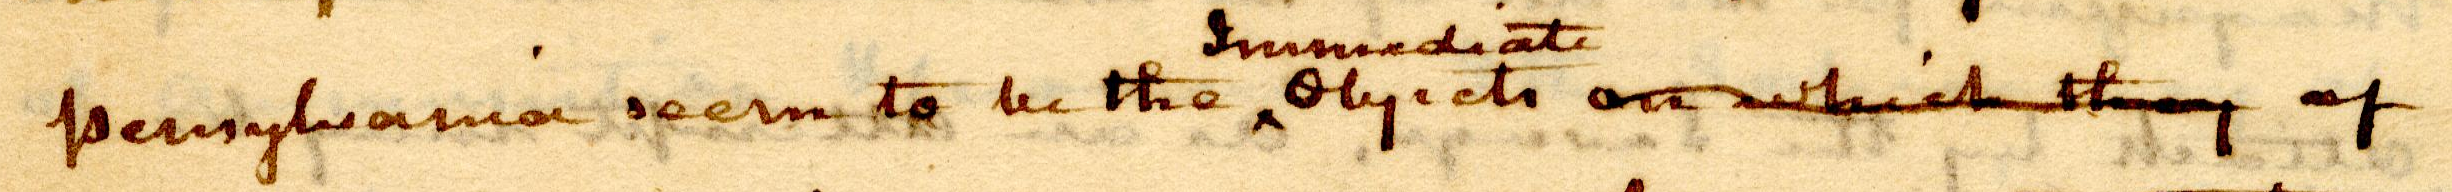Pennsylvania seem to be the ^ Objects [on which they] of
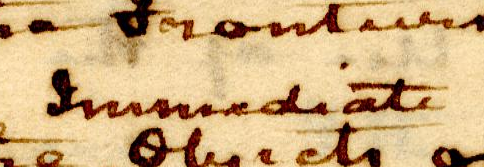Immediate
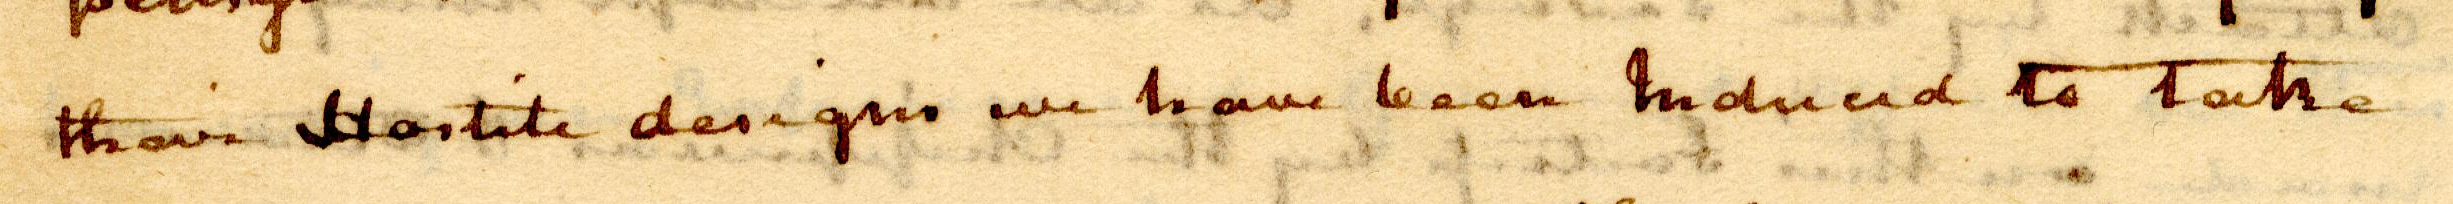their Hostile designs we have been Induced to take
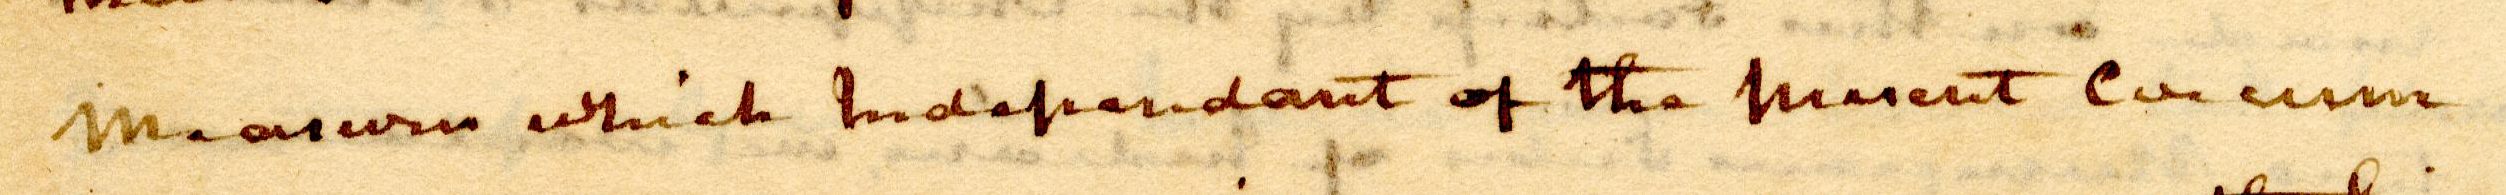Measures which Independant of the present circum
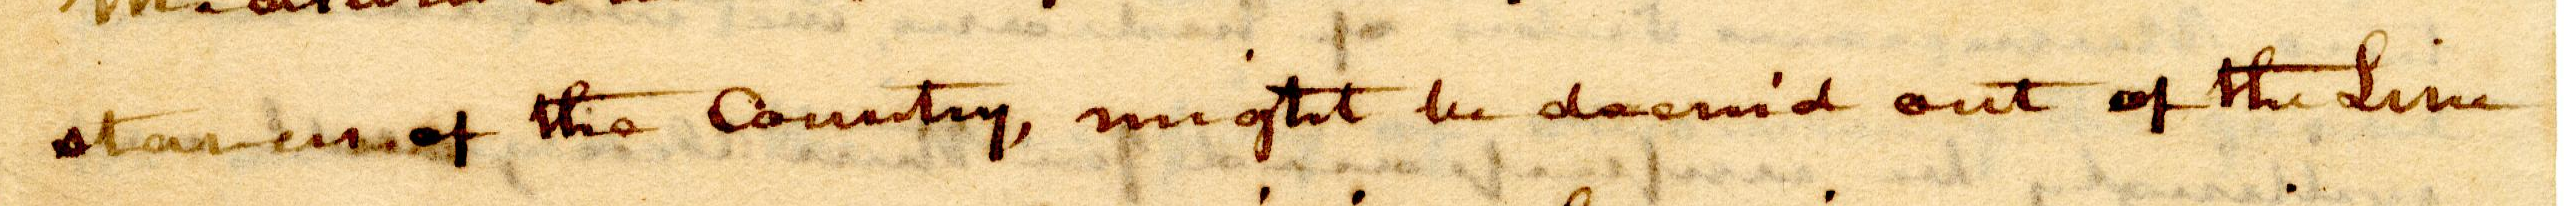stances of the Country, might be deem'd out of the Line
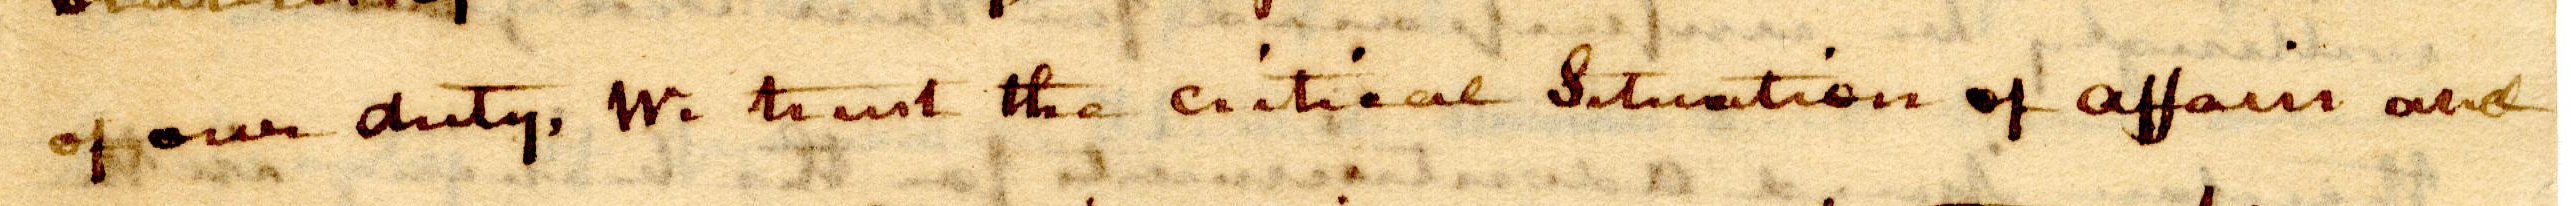of our duty, We treat the critical Situation of Affairs and
